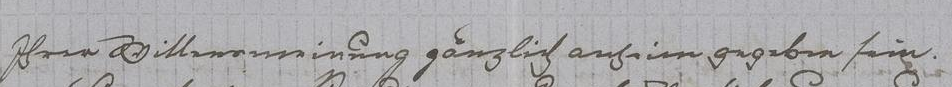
Ihrer Willensmeinung gänzlich anheim gegeben sein.
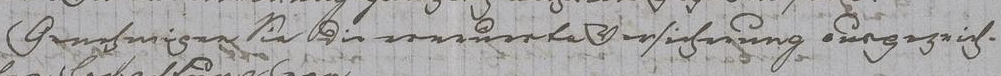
Genehmigen Sie die erneuerte Versicherung ausgezeich-
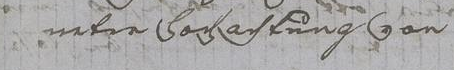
neter Hochachtung von
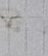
Bern
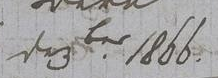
Dezber 1866.
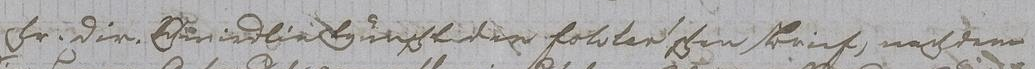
Hr. Dir. Schmiedlin wünscht den Fowler'schen Brief, nachdem
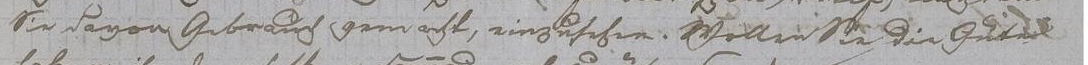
Sie davon Gebrauch gemacht, einzusehen. Wollen Sie die Güte
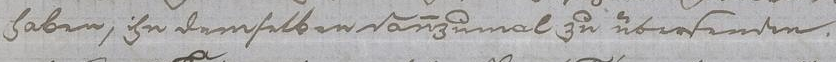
haben, ihn demselben dannzumal zu übersenden.
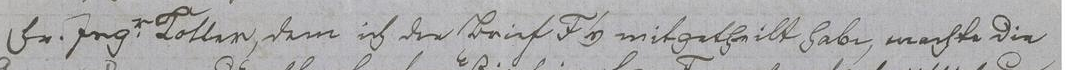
Hr. IngrKoller, dem ich den Brief F's mitgetheilt habe, machte die
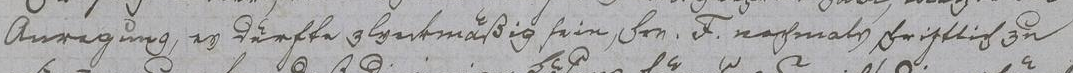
Anregung, es dürfte zweckmäßig sein, Hrn. F. nochmals schriftlich zu
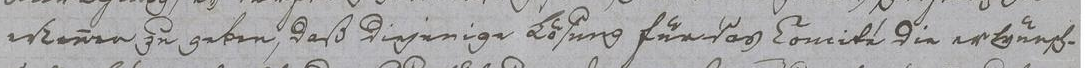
erkennen zu geben, daß diejenige Lösung für das Comité die erwünsch-
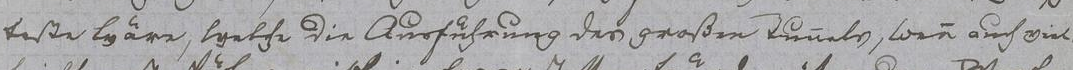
teste wäre, welche die Ausführung des großen Tunnels, wenn auch viel-
